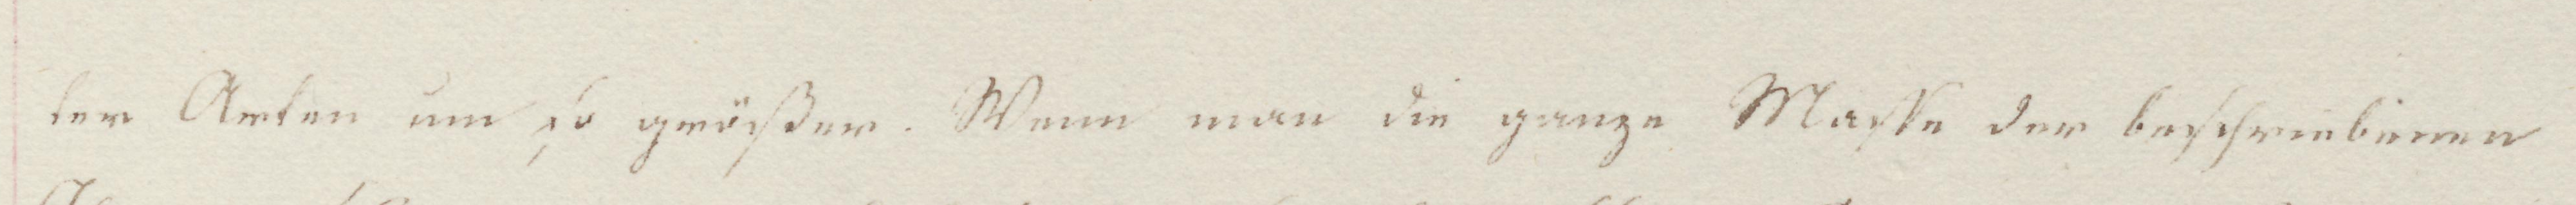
ter Arten um so größer. Wenn man die ganze Masse der beschriebenen
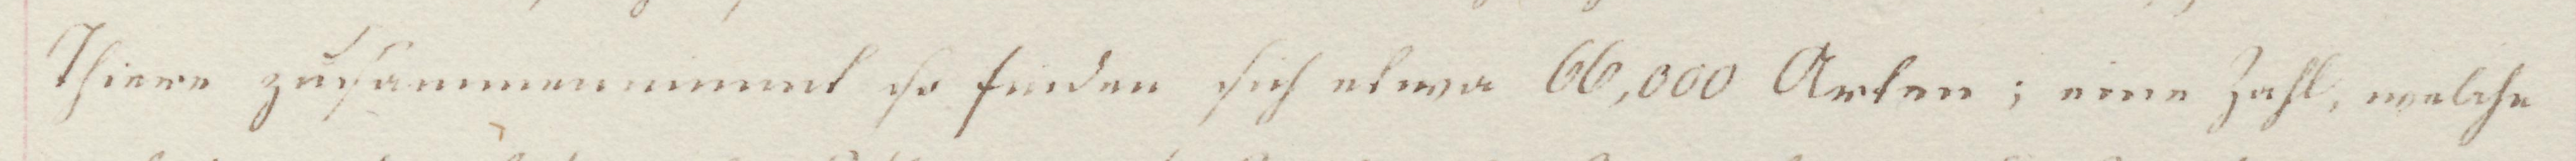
Thiere zusammennimmt so finden sich etwa 66,000 Arten; eine Zahl, welche
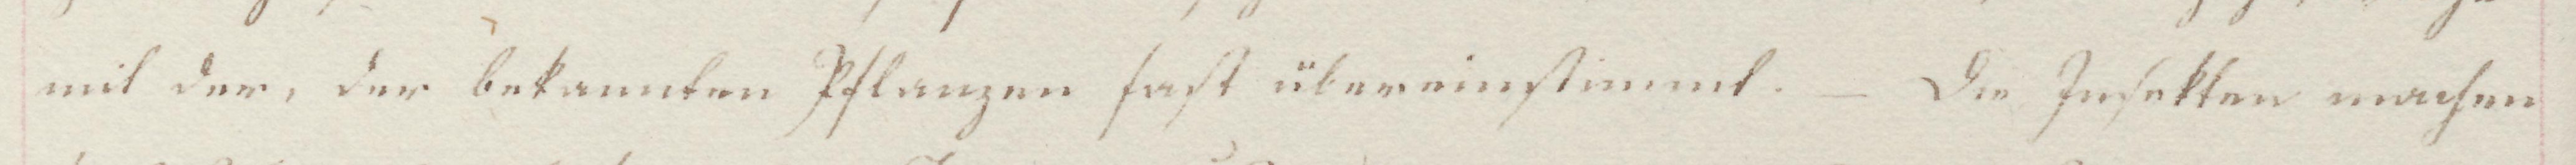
mit der, der bekannten Pflanzen fast übereinstimmt. – Die Insekten machen
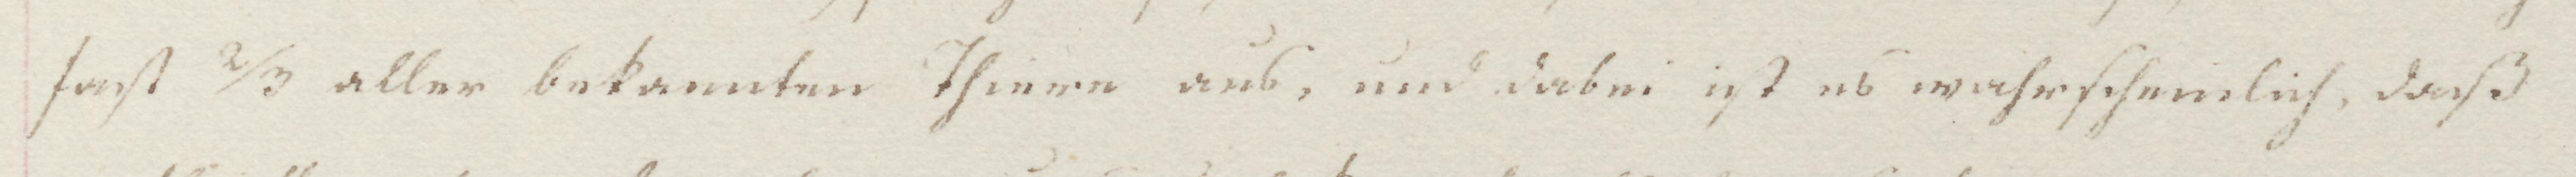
fast ⅔ aller bekannten Thiere aus, und dabei ist es wahrscheinlich, daß
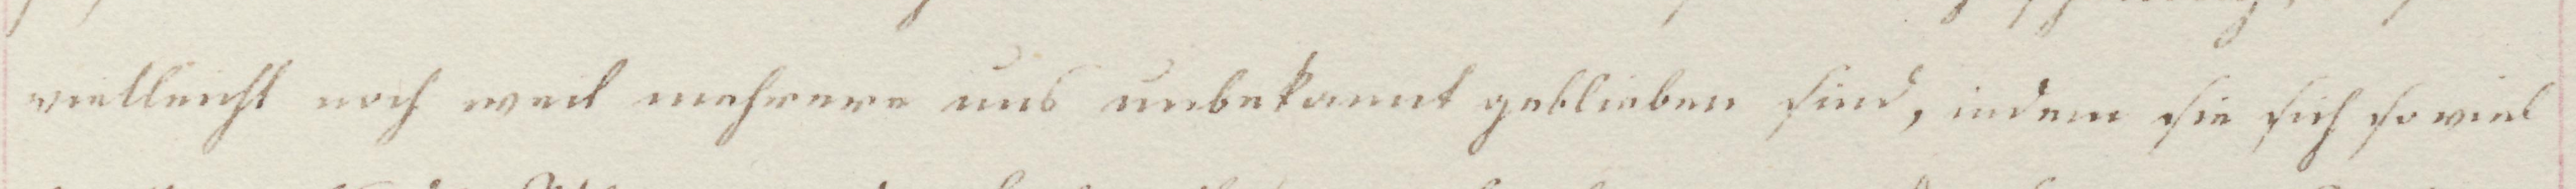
vielleicht noch weit mehrere uns unbekannt geblieben sind, indem sie sich so viel
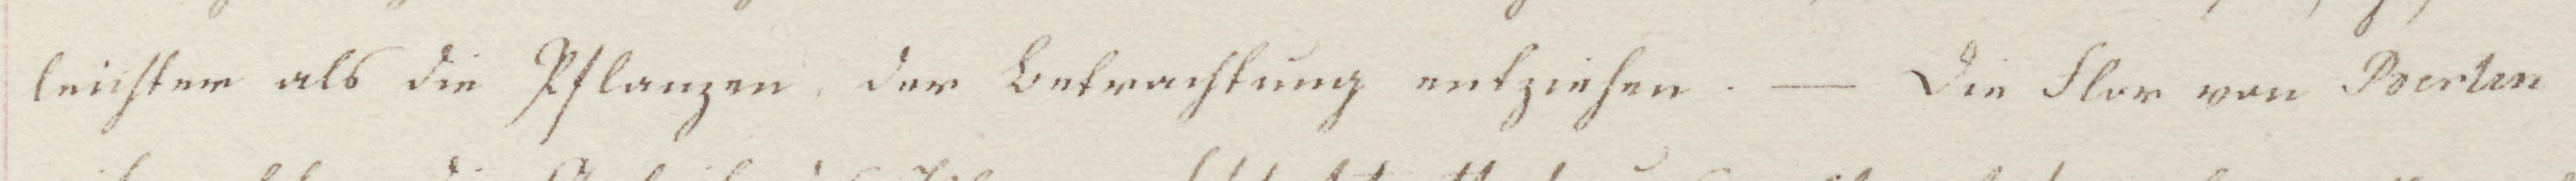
leichter als die Pflanzen, der Betrachtung entziehen. – Die Flur von Berlin
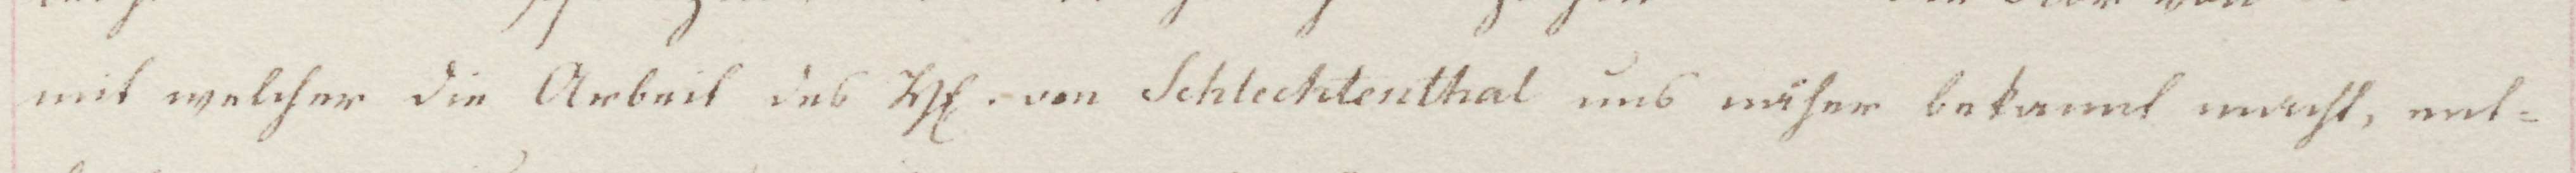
mit welcher die Arbeit des H￼. von Schlechtenthal uns näher bekannt macht, ent-
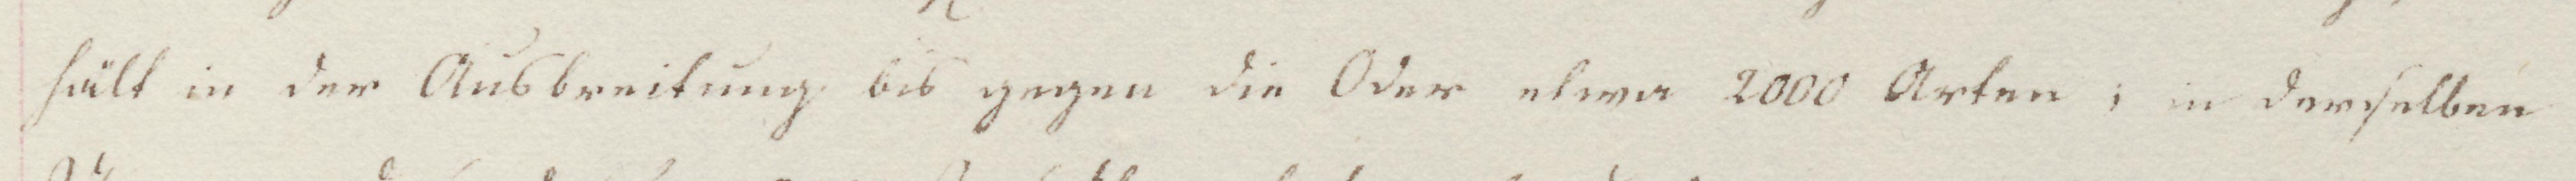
hält in der Ausbreitung bis gegen die Oder etwa 2000 Arten; in derselben
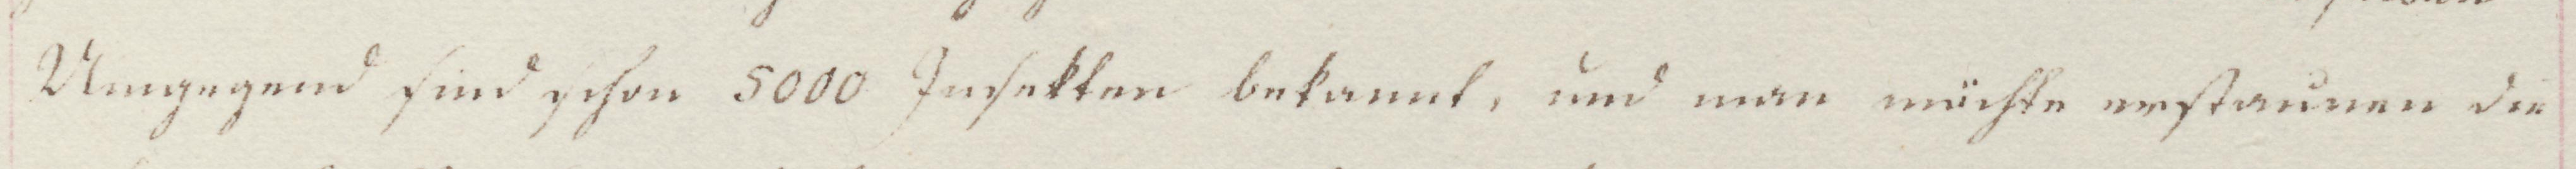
Umgegend sind schon 5000 Insekten bekannt, und man möchte erstaunen die
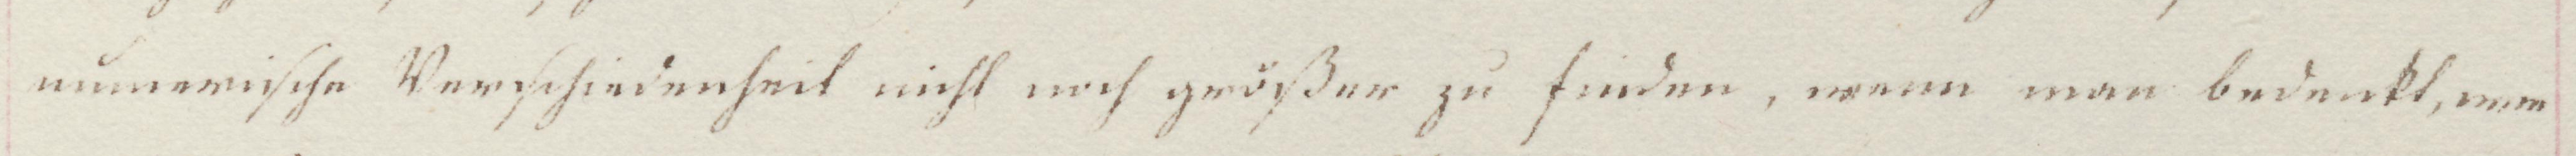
numerische Verschiedenheit nicht noch größer zu finden, wenn man bedenkt, wie
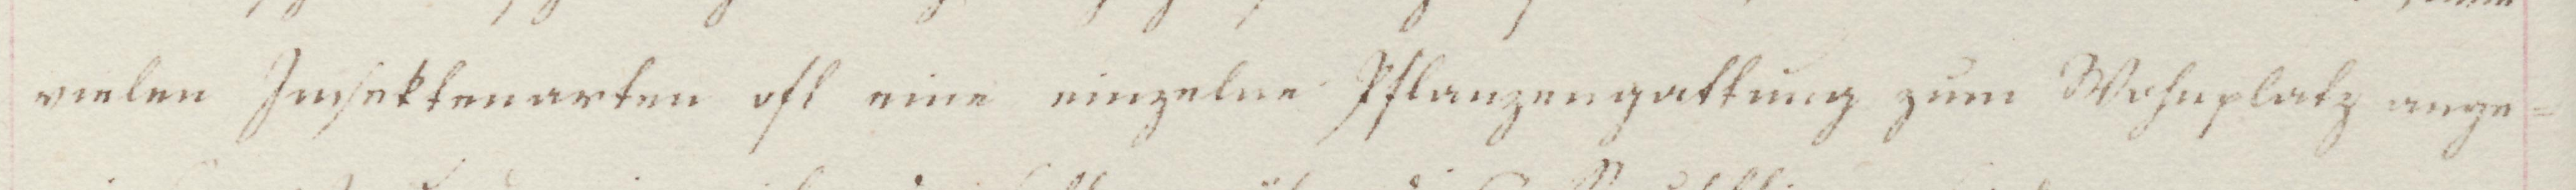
vielen Insektenarten oft eine einzelne Pflanzengattung zum Wohnplatz ange-
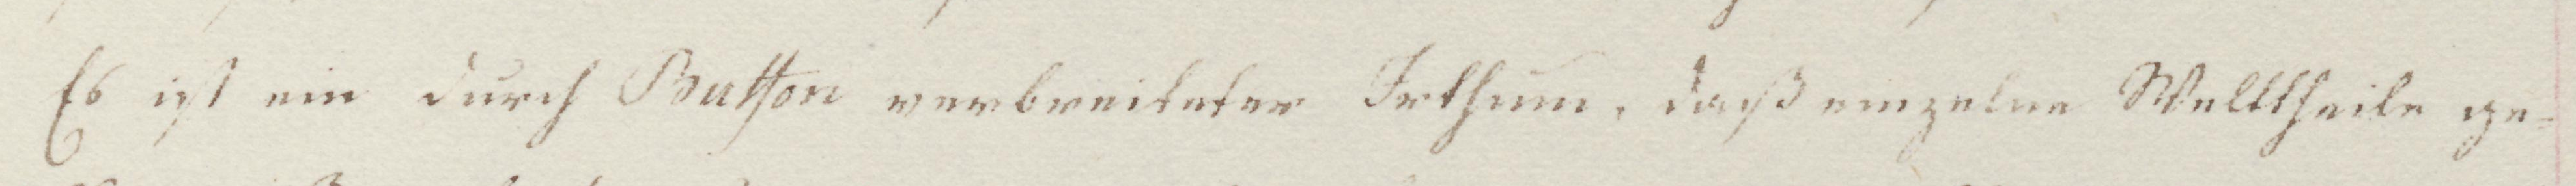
Es ist ein durch Buffon verbreiteter Irthum, daß einzelne Welttheile ge-
